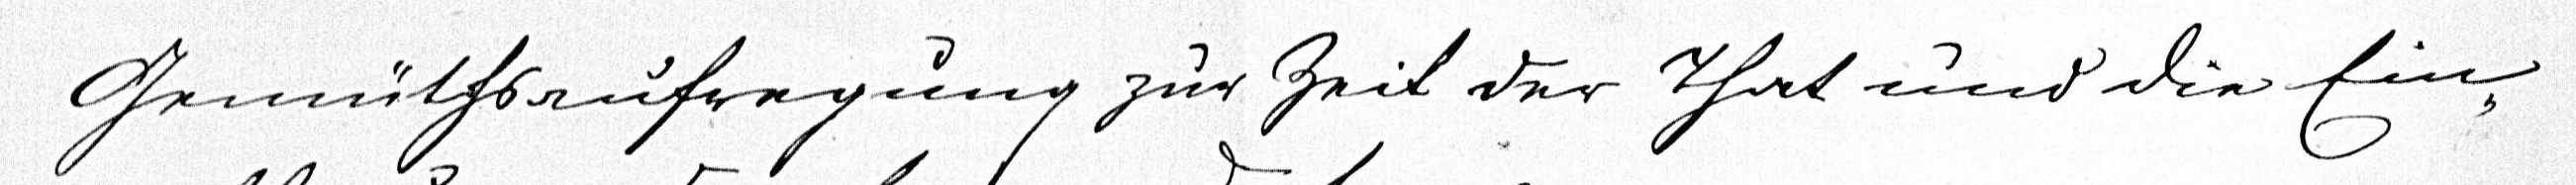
Gemüthsaufregung zur Zeit der That und die Ein¬
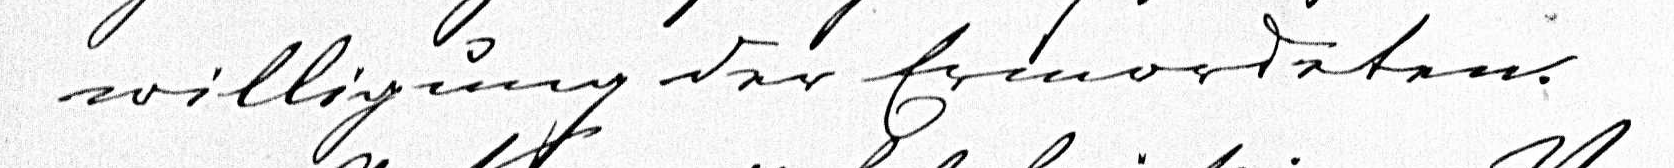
willigung der Ermordeten.
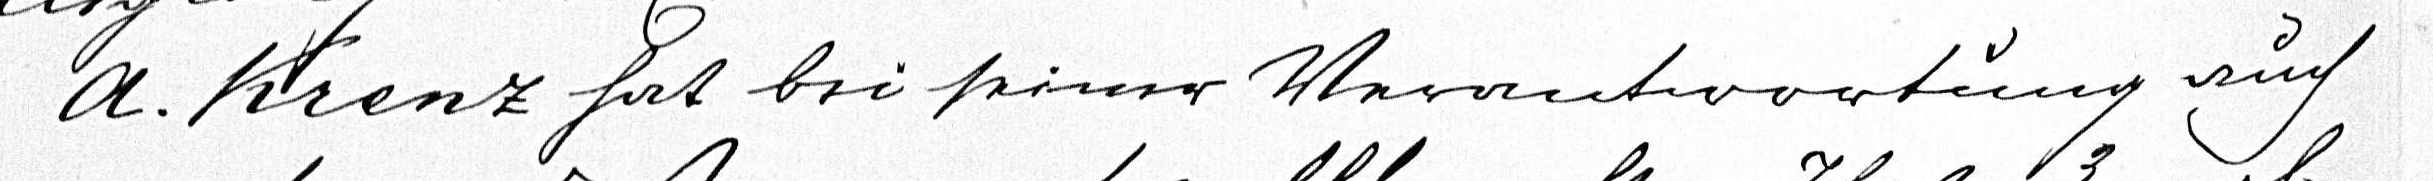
A. Krenz hat bei seiner Verantwortung auch
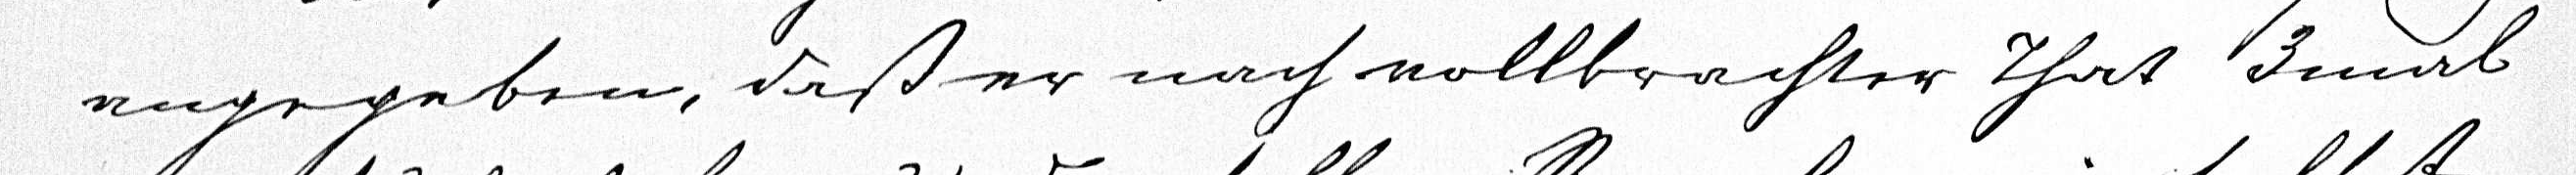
angegeben, daß er nach vollbrachter That 3mal
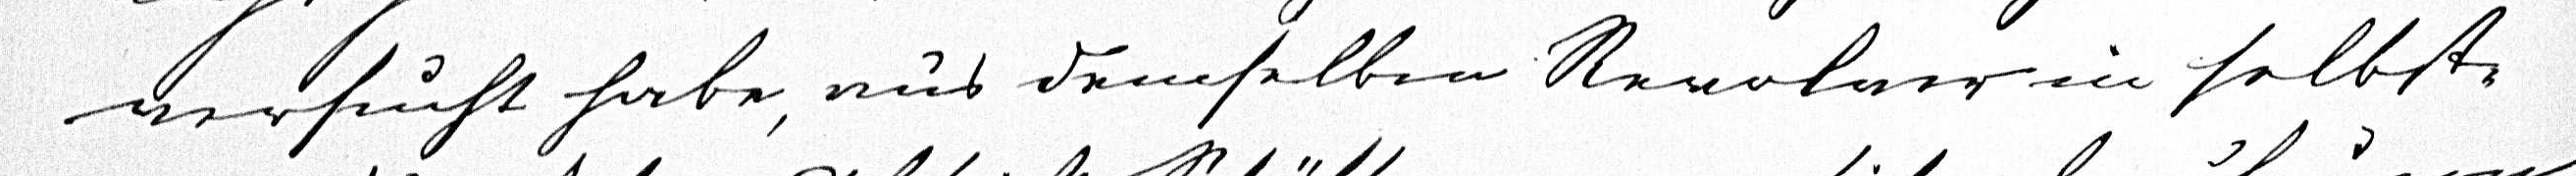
versucht habe, aus demselben Revolver in selbst¬
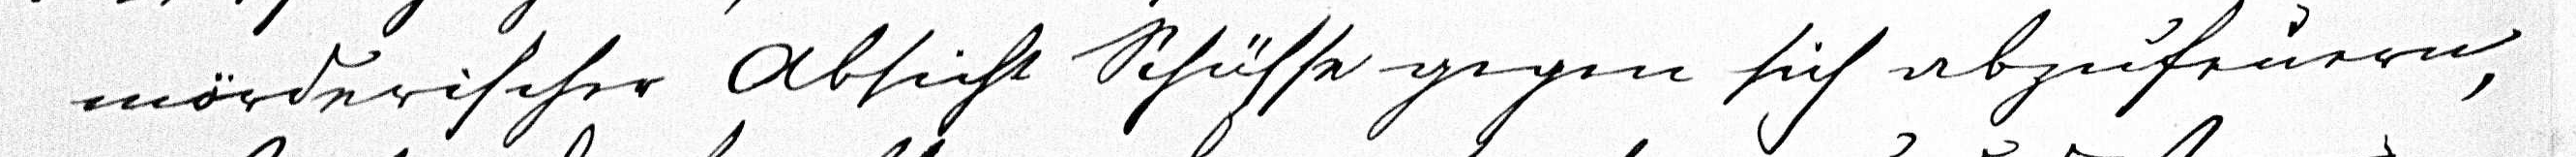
mörderischer Absicht Schüsse gegen sich abzufeuern,
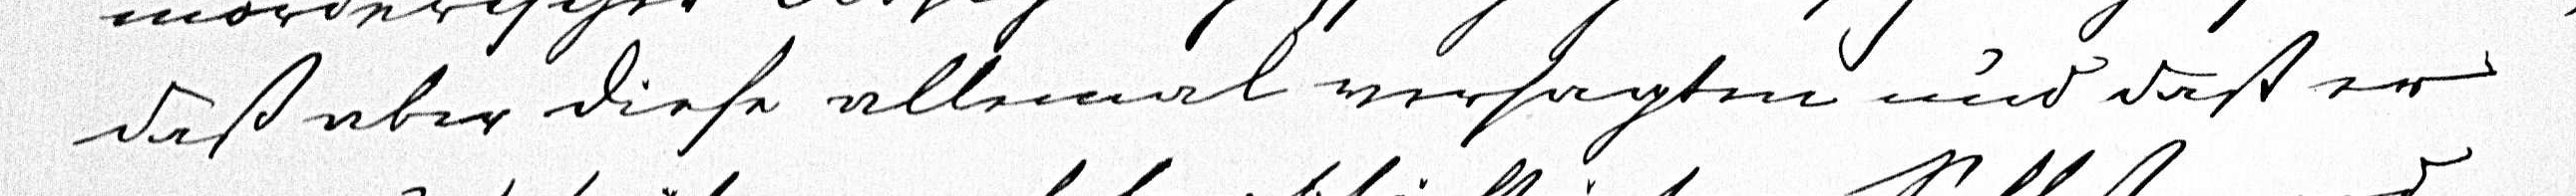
daß aber diese allemal versagten und daß er
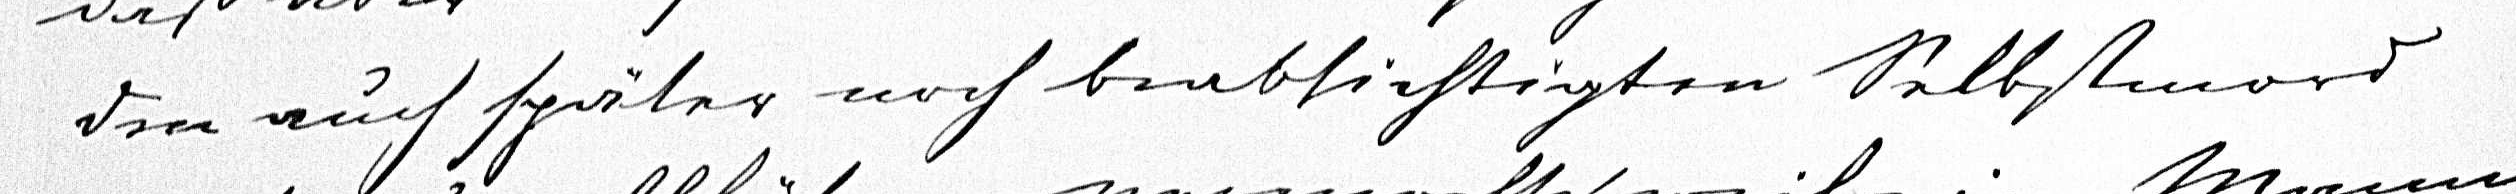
die auch später noch beabsichtigten Selbstmord
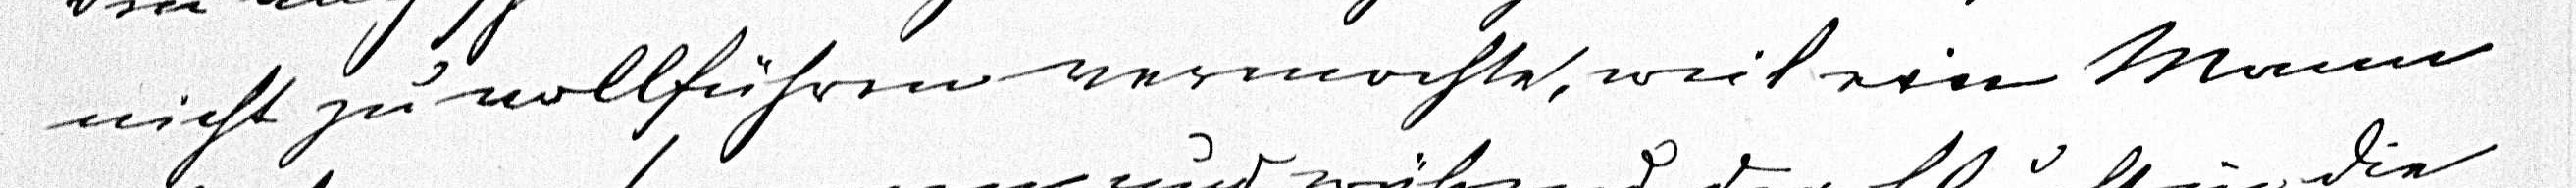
nicht zu vollführen vermochte, weil ein Mann
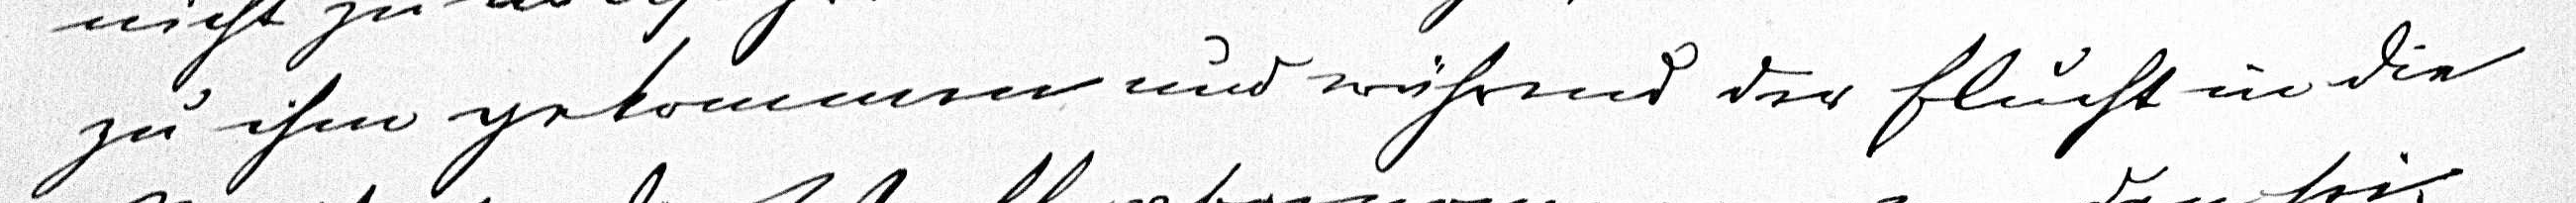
zu ihm gekommen und während der Flucht in die
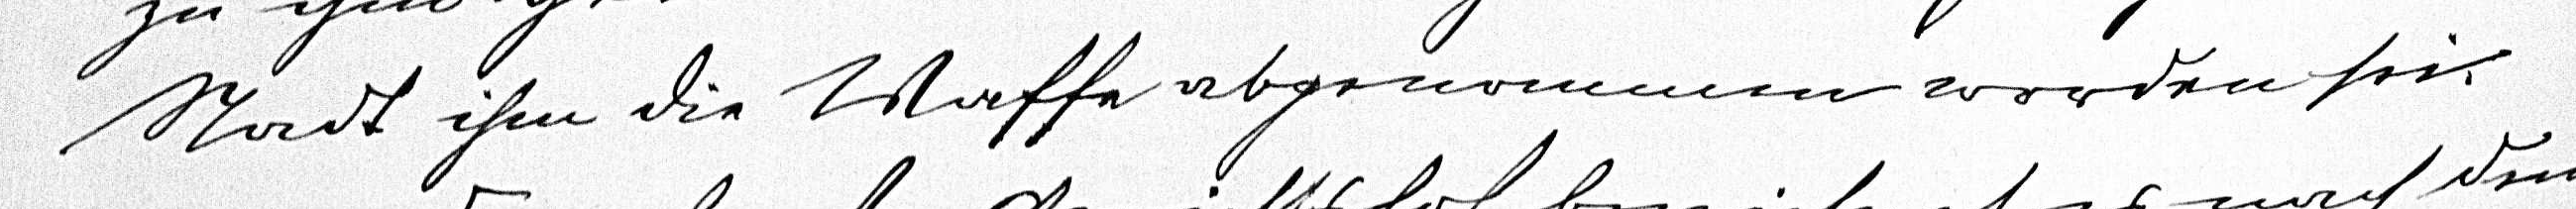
Stadt ihm die Waffe abgenommen worden sei.
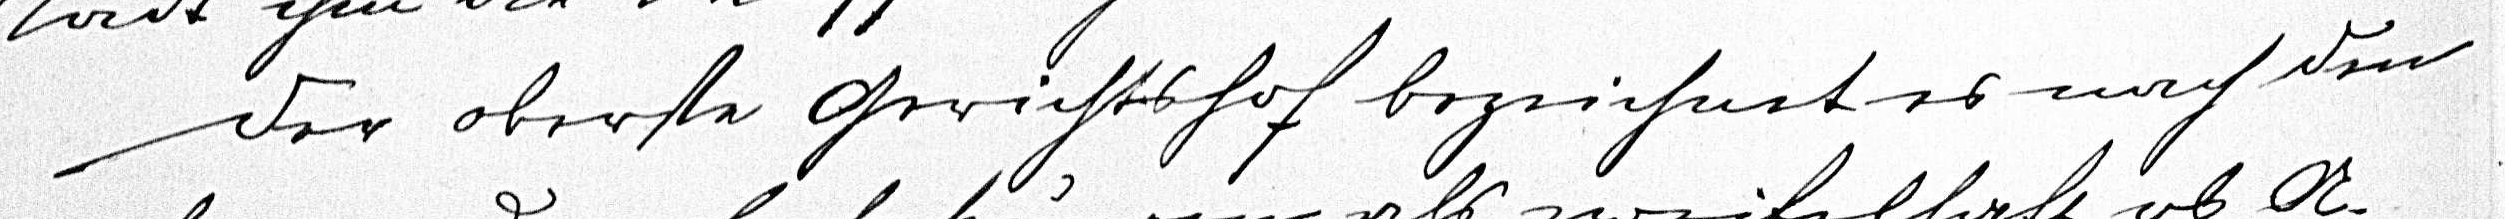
Der oberste Gerichtshof Gezeichnet es nach den
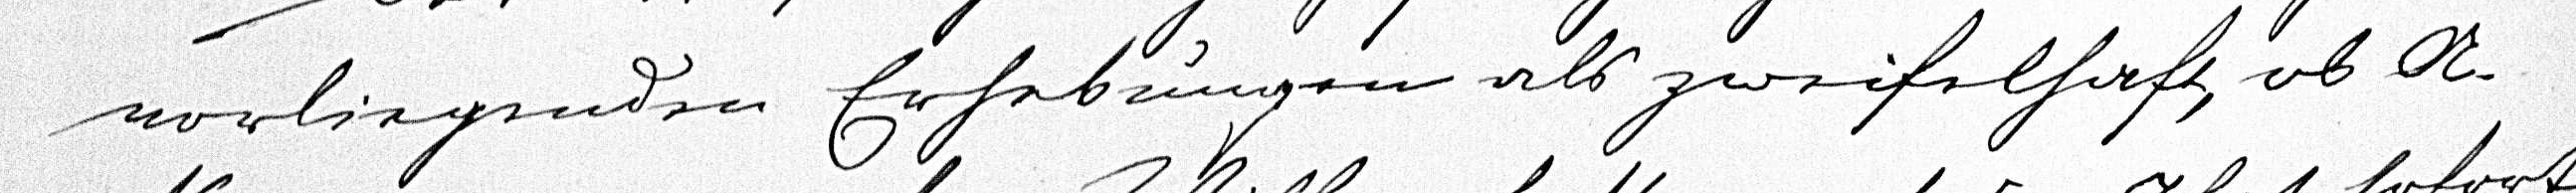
vorliegenden Erhebungen als zweifelhaft, ob A.
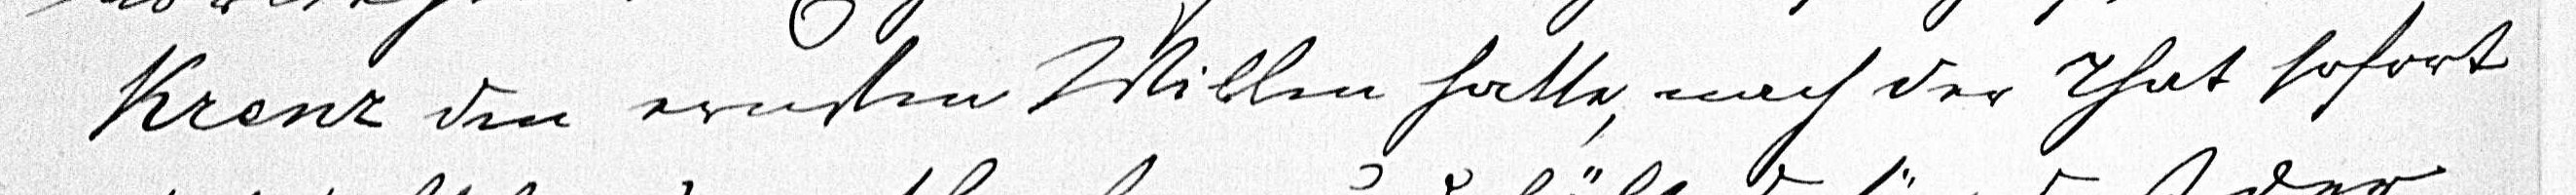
Krenz den ernsten Willen hatte, nach der That sofort
